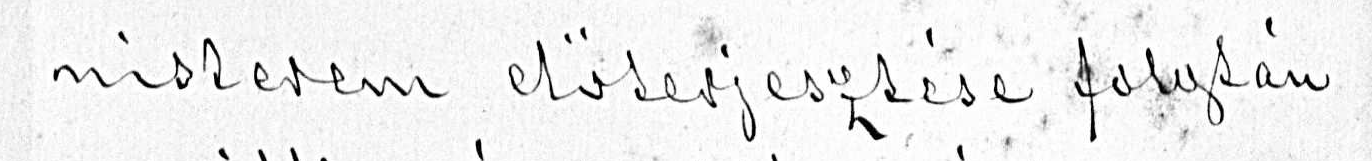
nisterem elöterjestése folgtán
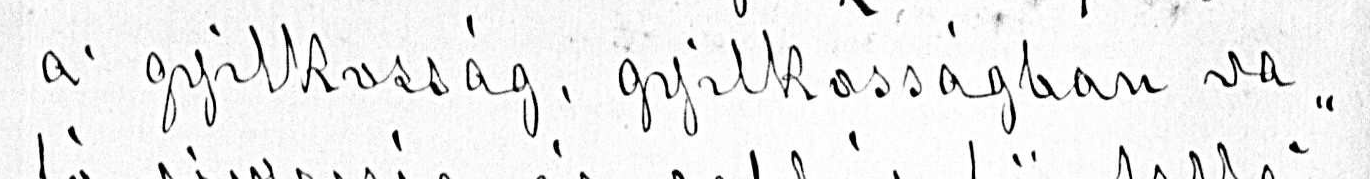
a' gyilkosság, gyilkosságban va¬
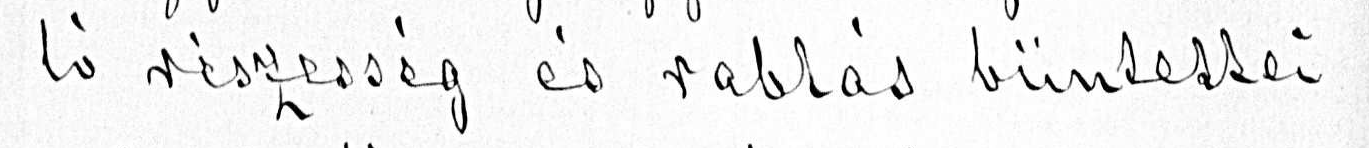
ló részesség és rablás büntettei
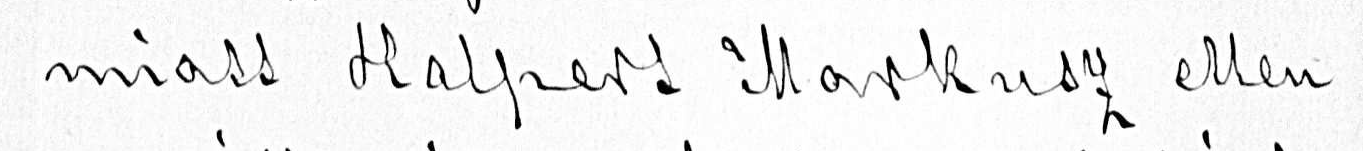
miatt Halpert Markusz ellen
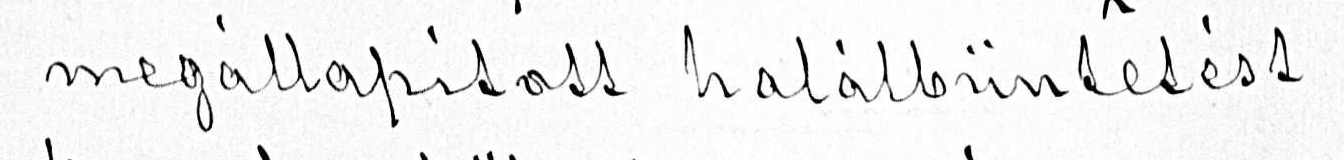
megállapitatt halálbüntetést
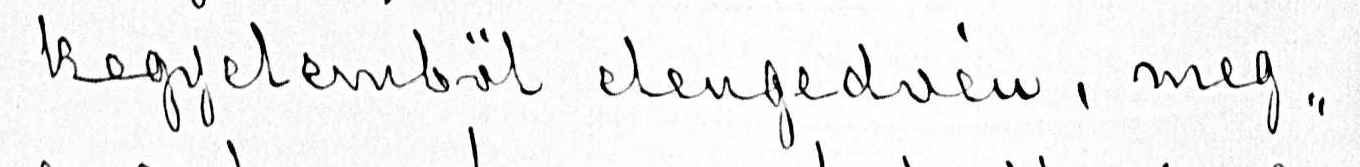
kegyelemböl elengedvén, meg¬
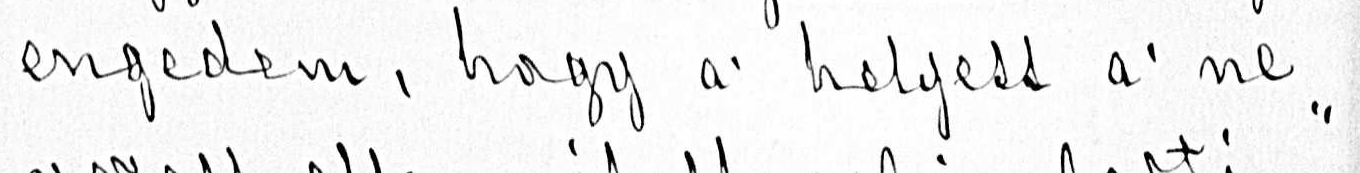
engedem, hagy a' helgett a' ne¬
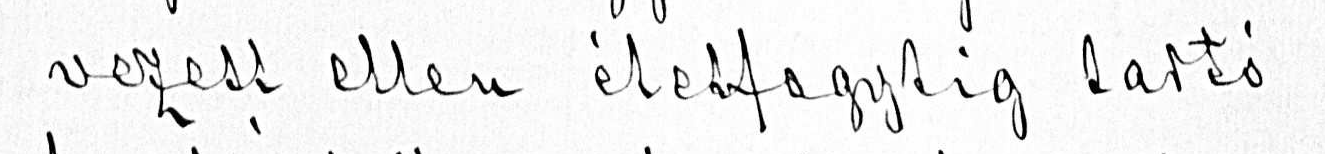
vezett ellen étetfagytig tartó
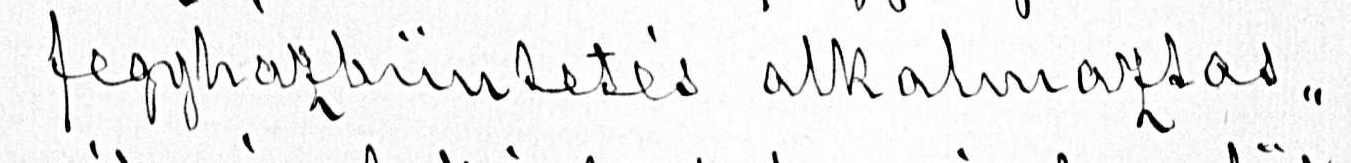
fegyházbüntetés alkalaztas¬
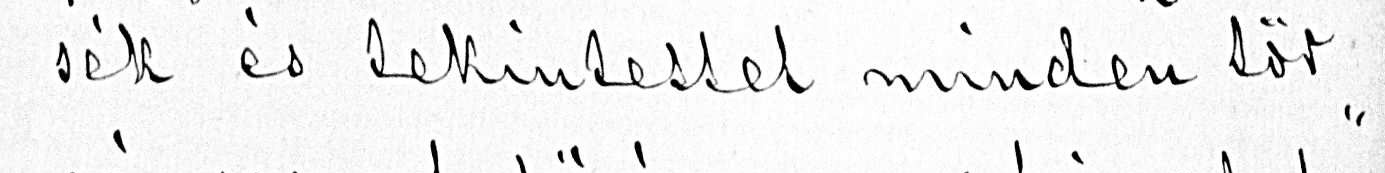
sék és tekintestel minden tör¬
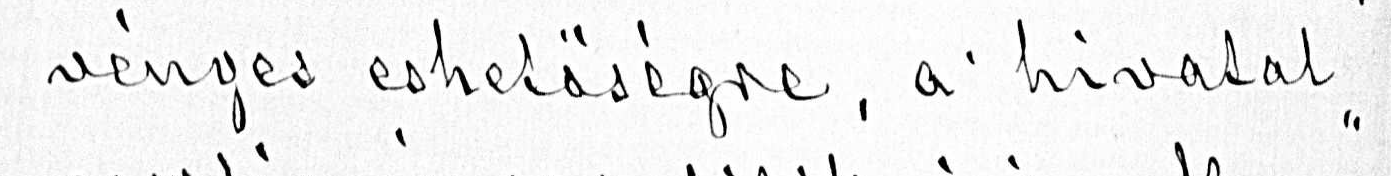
vénges eshetöségre, a' hivatal¬
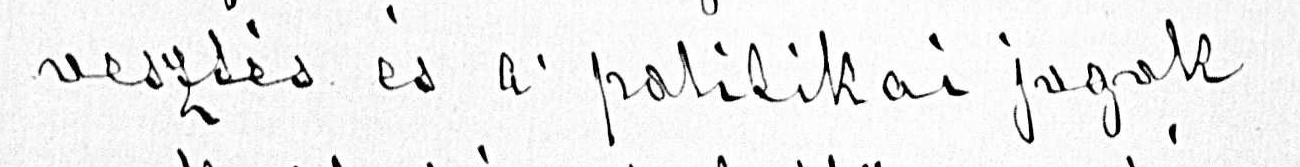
vesztés és a' politikai jogok
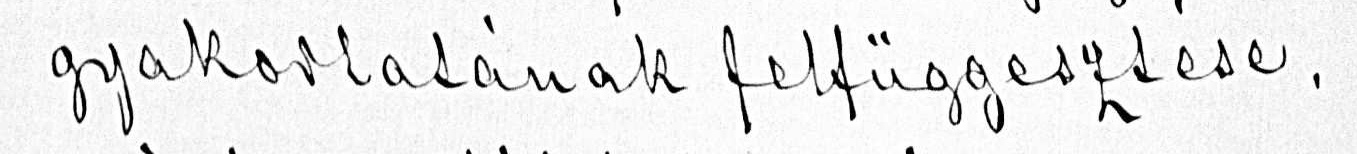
gzakorlatának felfüggesztése,
